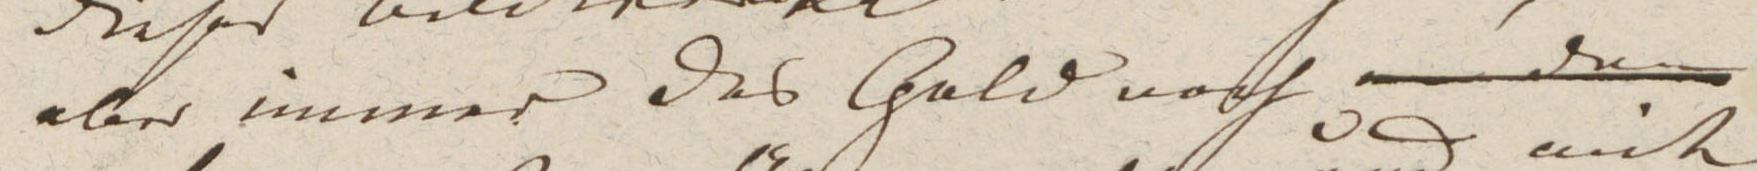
aber immer das Gold noch den
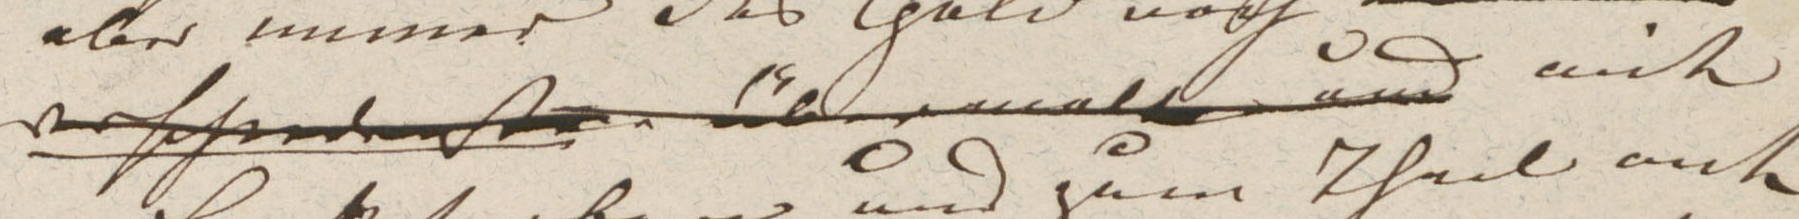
verschiedensten übermalt und mit
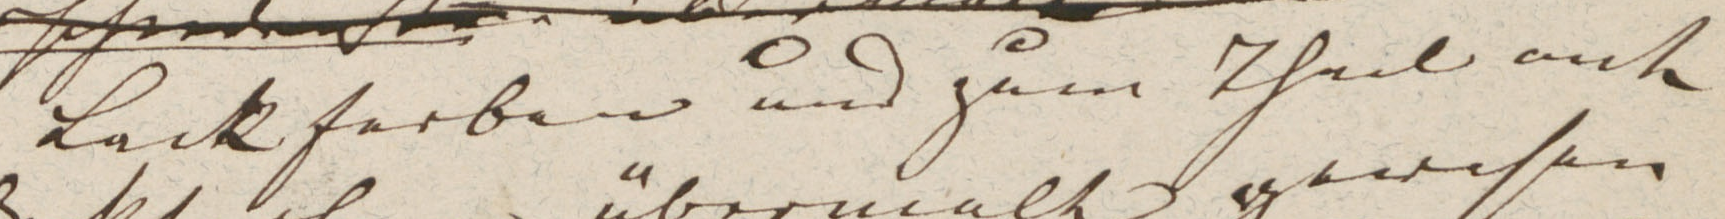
Lackfarben und zum Theil mit
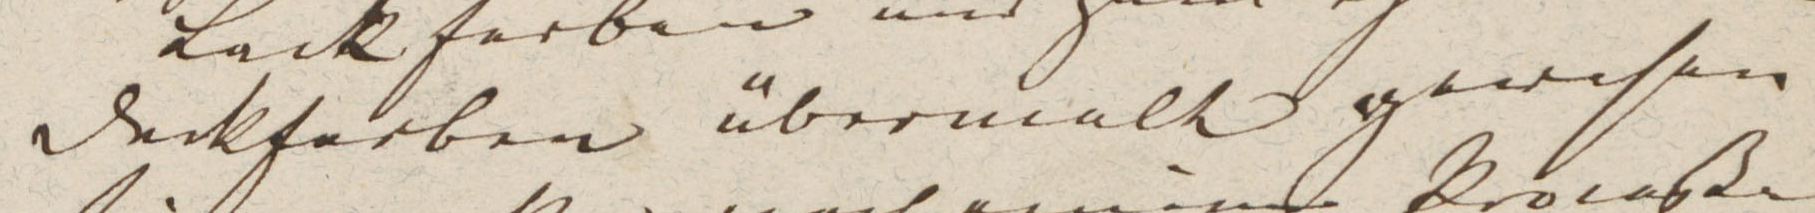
Deckfarben übermalt gewesen
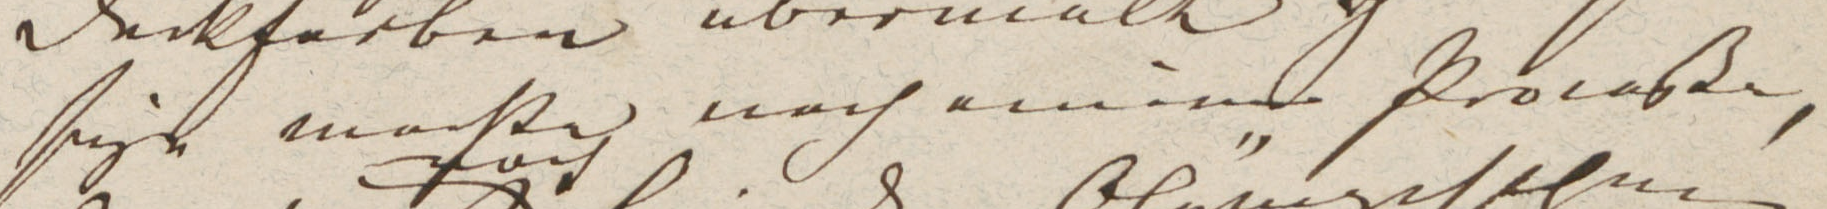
seyn mochte nach einem Processe,
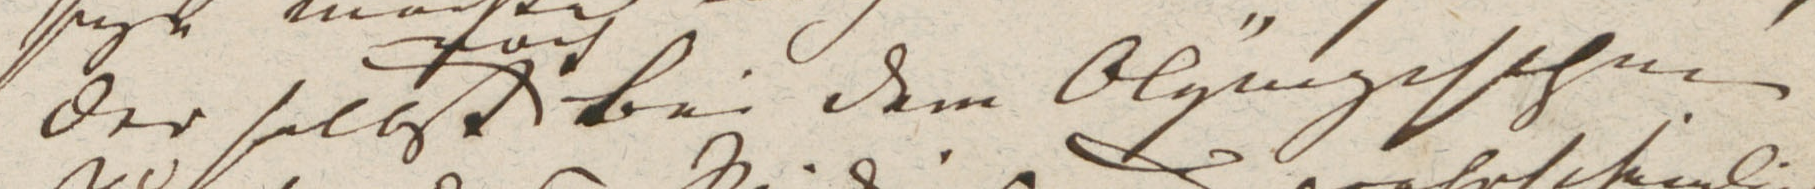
der selbst noch bei dem Olympischen
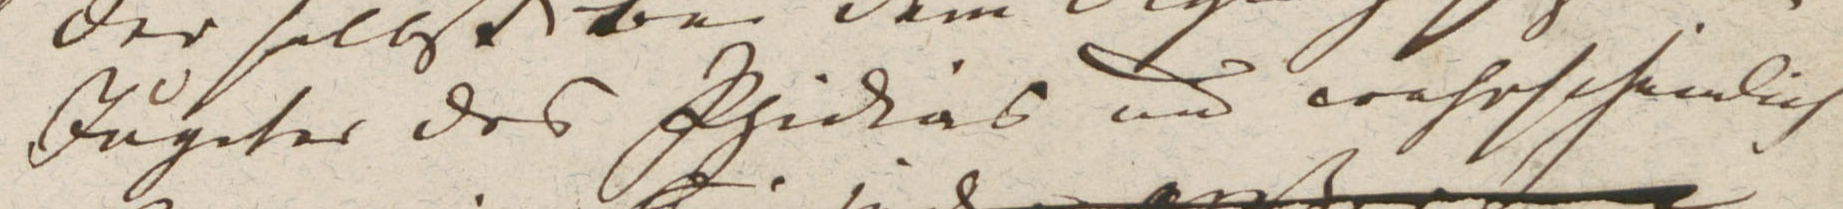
Jupiter des Phidias und wahrscheinlich
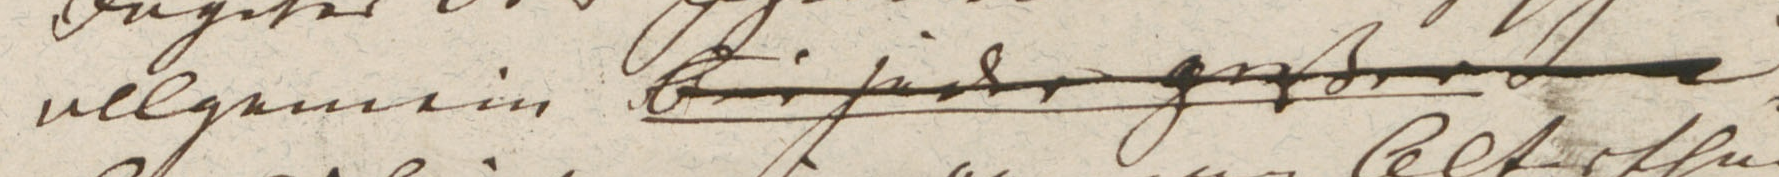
allgemein bei jeder grosseren
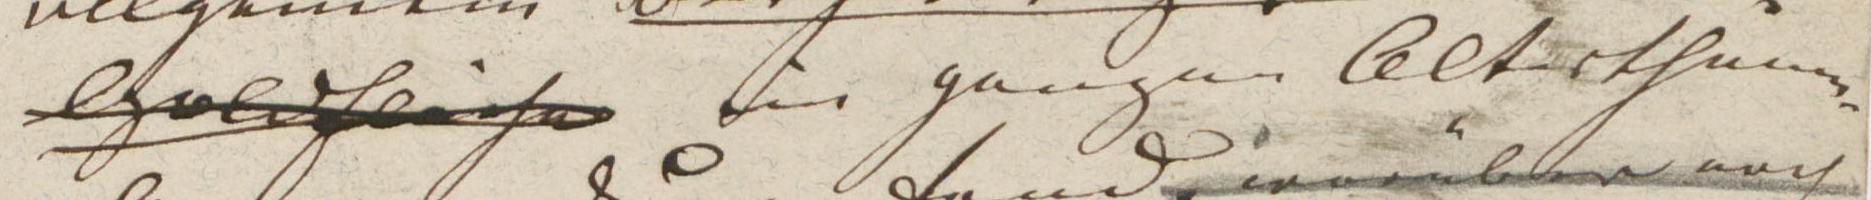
Goldfläche im ganzen Alterthum
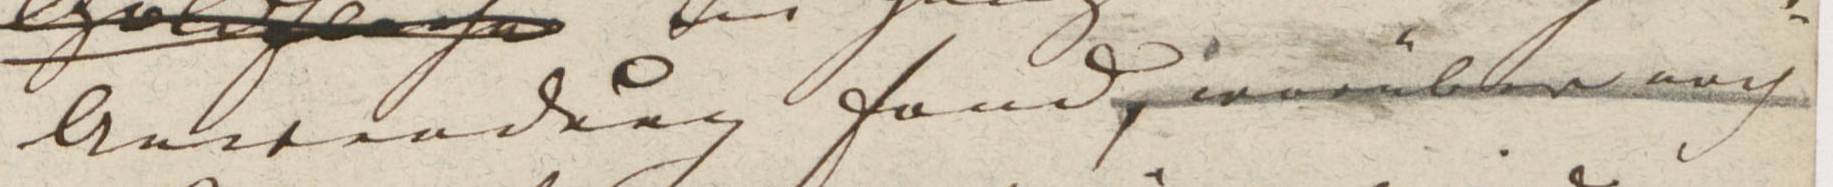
Anwendung fand, worüber noch
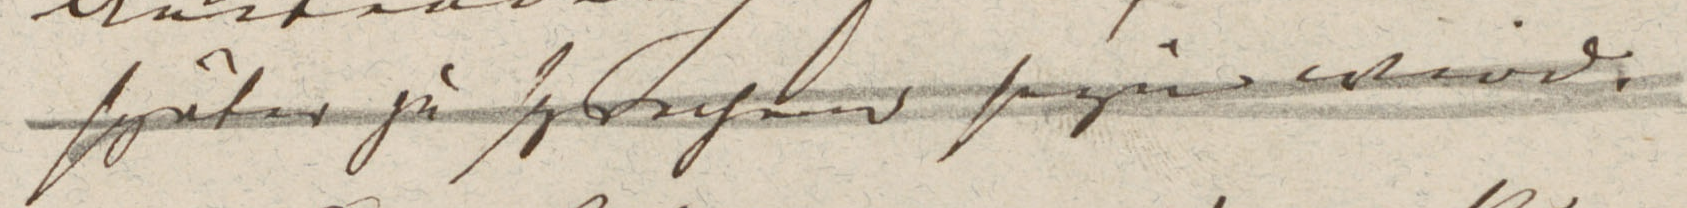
später zu sprechen seyn wird. –
